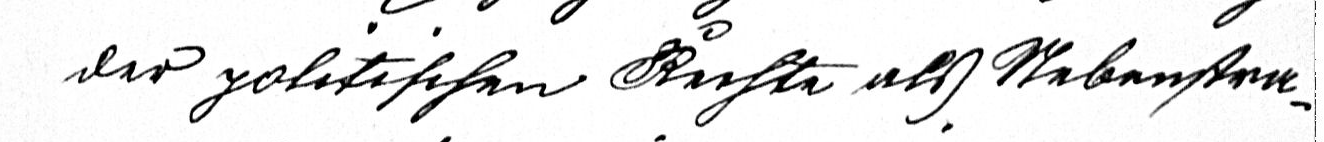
der politischen Rechte als Nebenstrafe
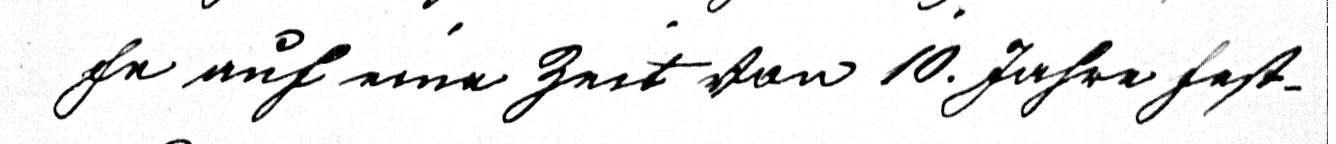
auf eine Zeit von 10. Jahre fest¬
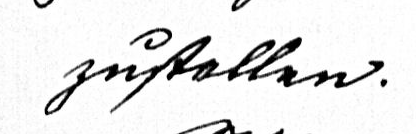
zustellen.
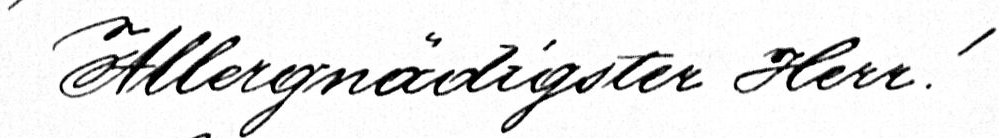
Allergnädigster Herr.'
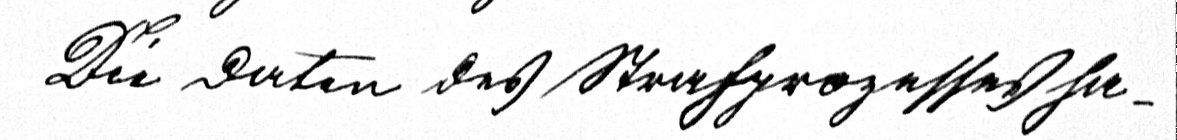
Die Daten des Strafprozesses ha¬
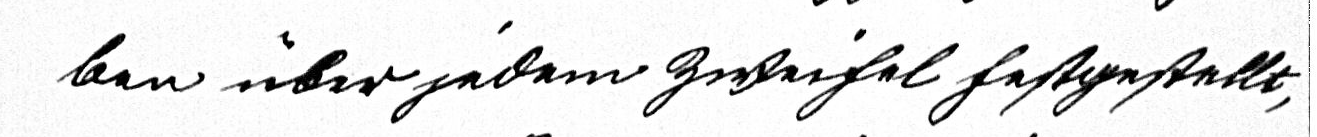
ben über jedem Zweifel festgestellt,
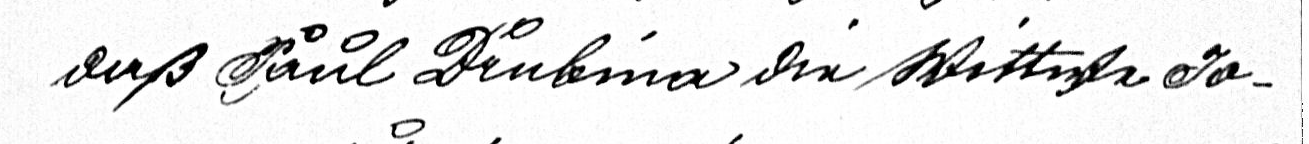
daß Paul Drubina die Wittwe Jo¬
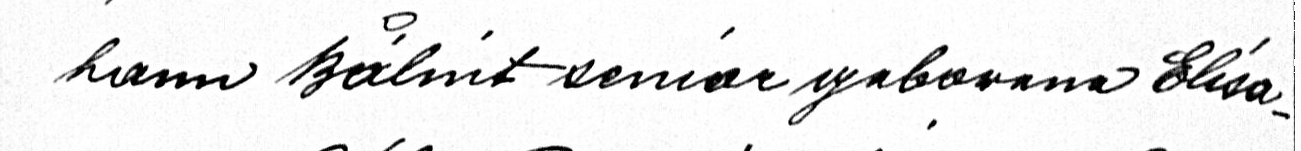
hann Bálint senior geborene Elisa¬
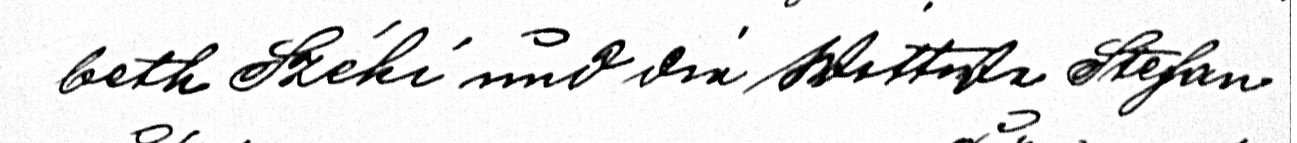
beth Széki und die Wittwe Stefan
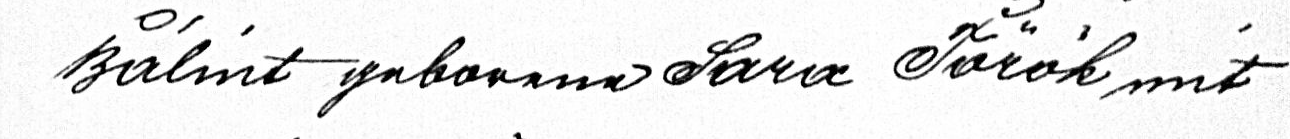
Bálint geboren Sara Török mit
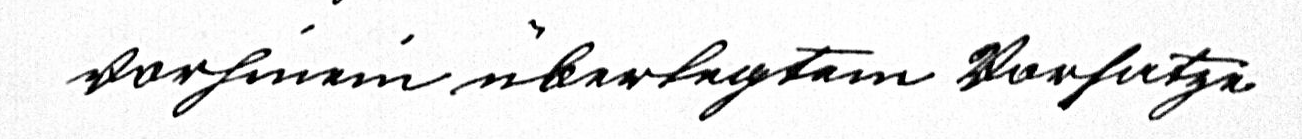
vorhinein überlegtem Vorsatze
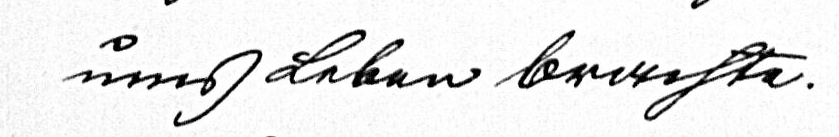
ums Leben brachte.
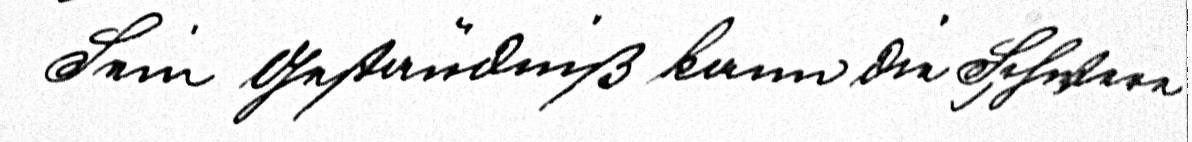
Sein Geständniß kann die Schwere
